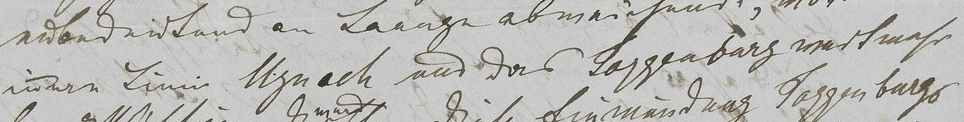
innere Linie Uznach und das Toggenburg weit mehr
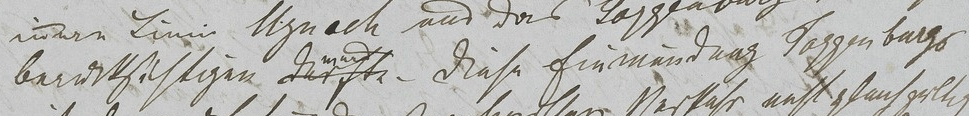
berücksichtigen dürftewürde. Diese Einmündung Toggenburgs
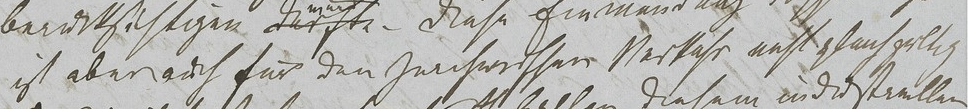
ist aber auch für den Zürcherischen Verkehr nicht gleichgültig
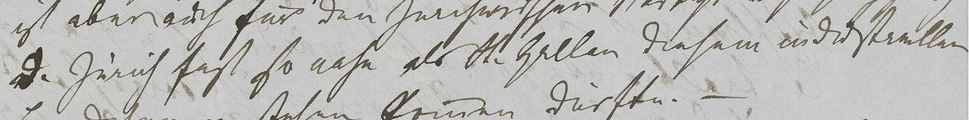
da Zürich fast so nahe als St. Gallen diesem industriellen
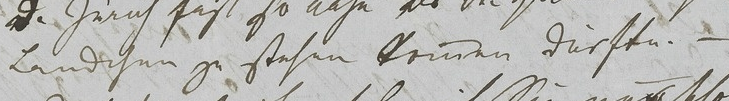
Ländchen zu stehen kommen dürfte. –
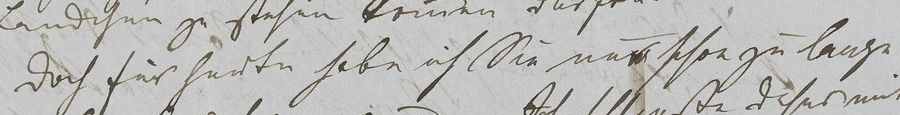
Doch für heute habe ich Sie nun schon zu lange
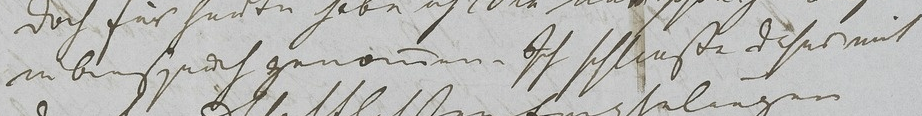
in Anspruch genommen. Ich schließe daher mit
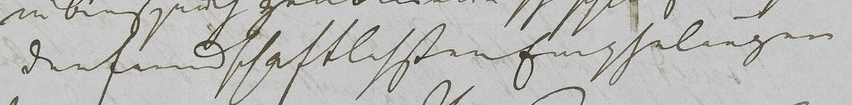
den freundschaftlichsten Emphelungen
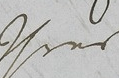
Ihres
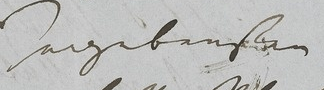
ergebensten
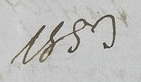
1853
